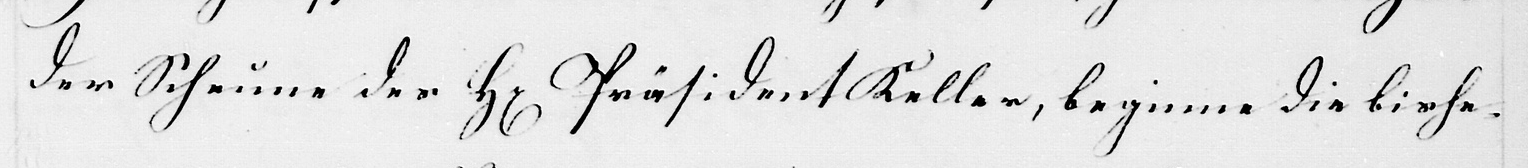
der Scheune des H[errn] Präsident Keller, beginne die bishe¬
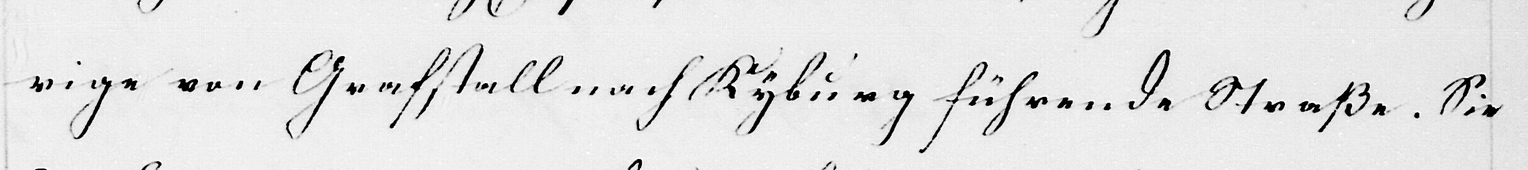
rige von Grafstall nach Kyburg führende Straße. Sie
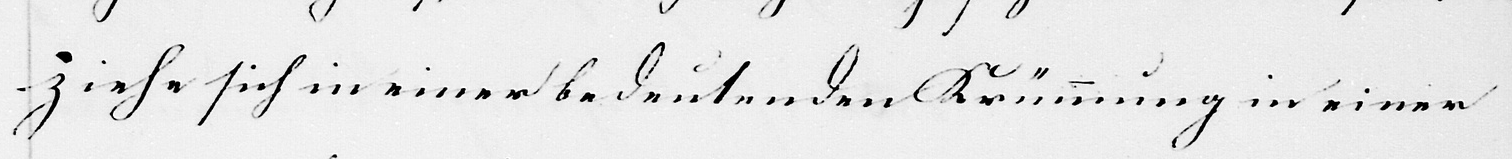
ziehe sich in einer bedeutenden Krümmung in einer
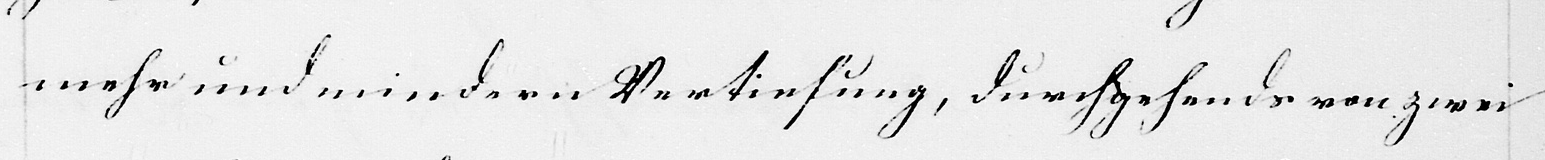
mehr und mindern Vertiefung, durchgehends von zwei
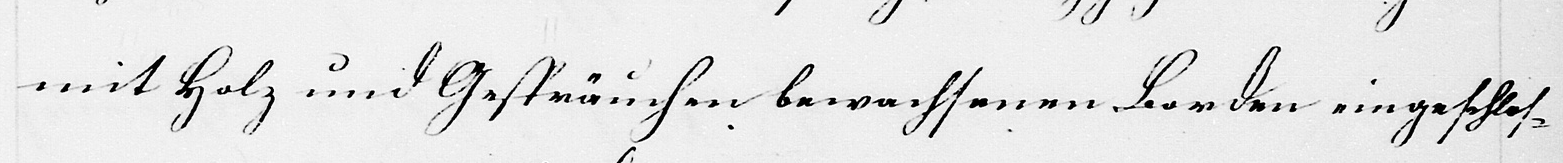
mit Holz und Gesträuchen bewachsenen Borden eingeschlos¬
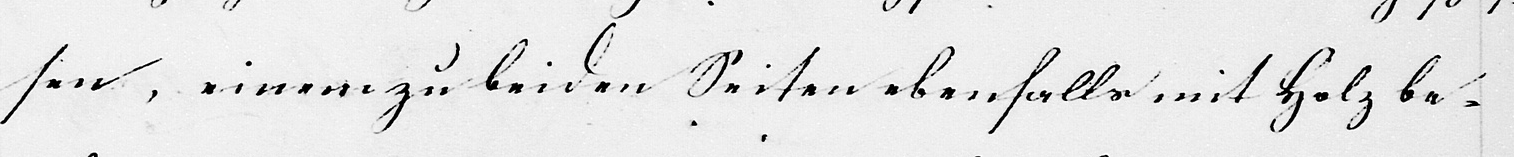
sen, einem zu beiden Seiten ebenfalls mit Holz be¬
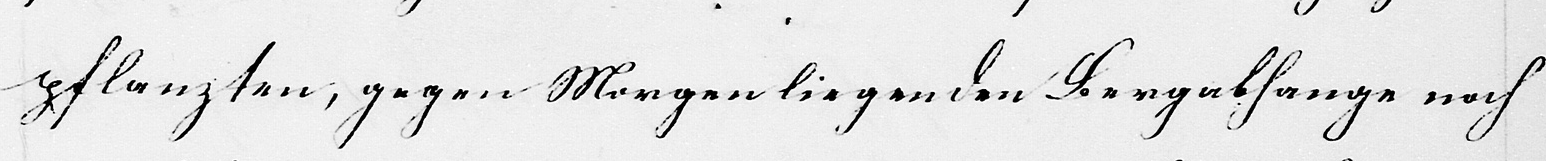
pflanzten, gegen Morgen liegenden Bergabhange noch
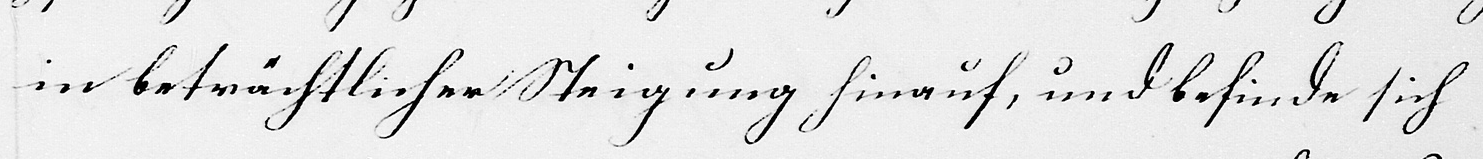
in beträchtlicher Steigung hinauf, und befinde sich
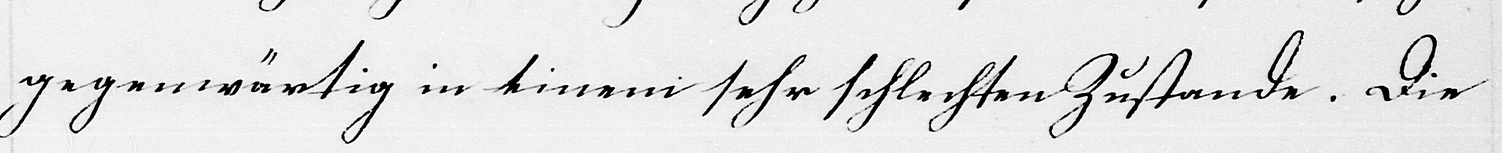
gegenwärtig in einem sehr schlechten Zustande. Die
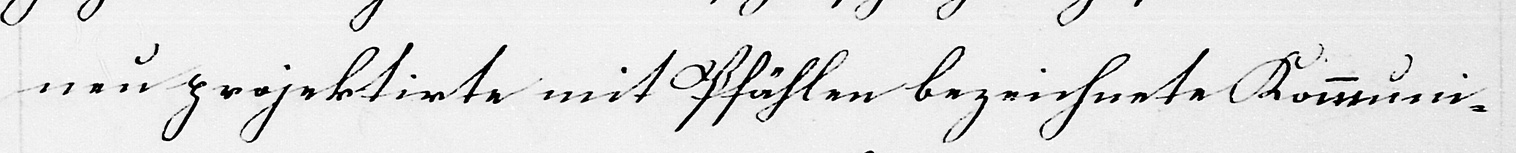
neu projektirte mit Pfählen bezeichnete Kommuni¬
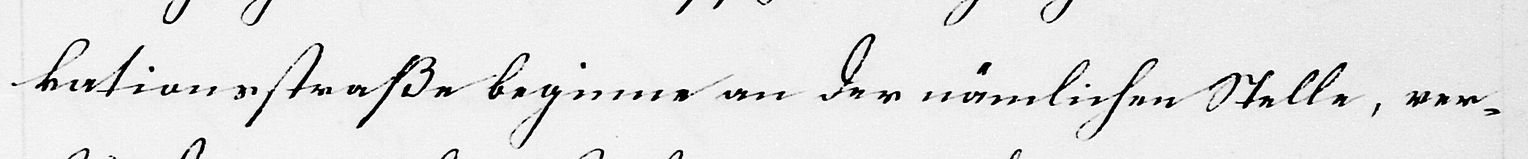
kationsstraße beginne an der nämlichen Stelle, ver¬
